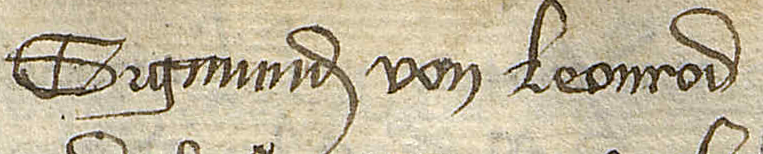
Sigmund* von Leonrod
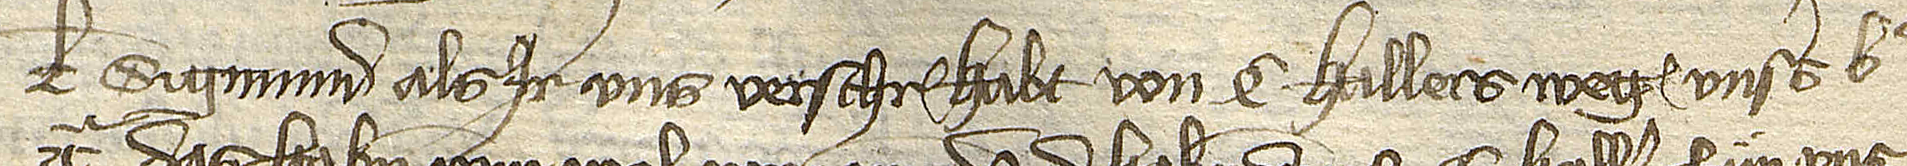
L* Sigmund als Ir vns verſchr* habt von C* . Hallers weg* vnſ*s b*
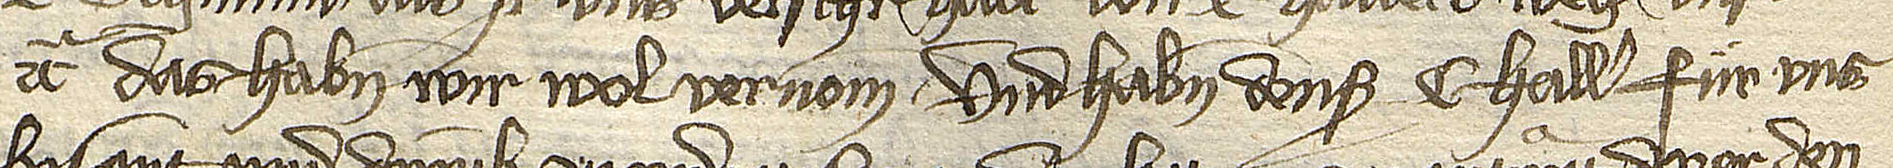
ec* das habn* wir wol vernom* / Vnd habn* denſ* C* hall* für vns
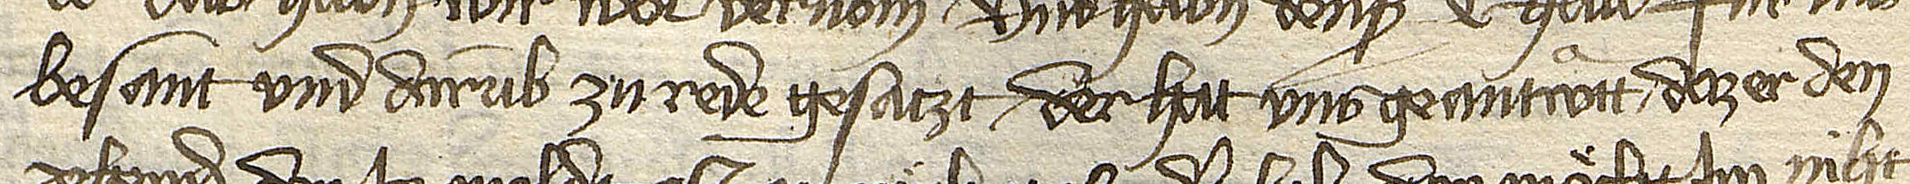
beſant vnd darub* ʒu rede geſacʒt / Der hat vns geantw*tt / daʒ er den
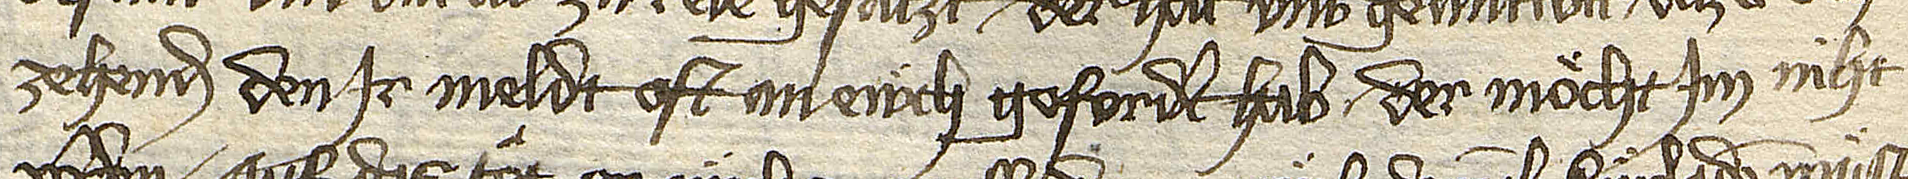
ʒehend* den Ir meldt oft an eẅch geford*t hab / Der möcht Im niht
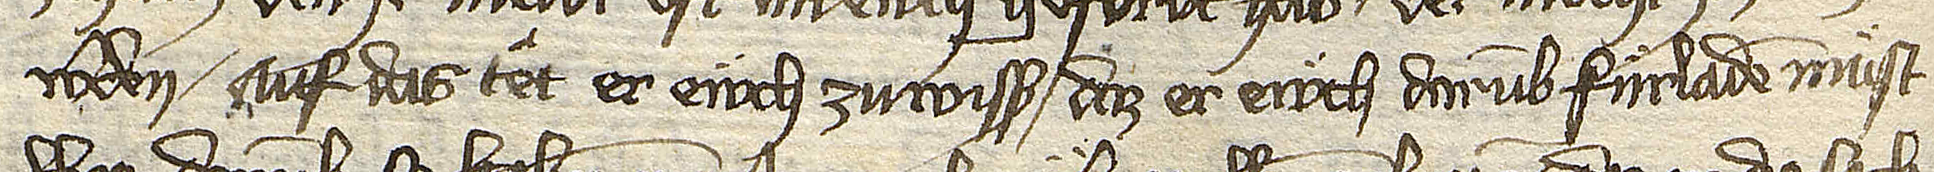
w*den / auf das tët er eẅch ʒu wiſſ* / daʒ er eẅch darub* fürlade* müſt
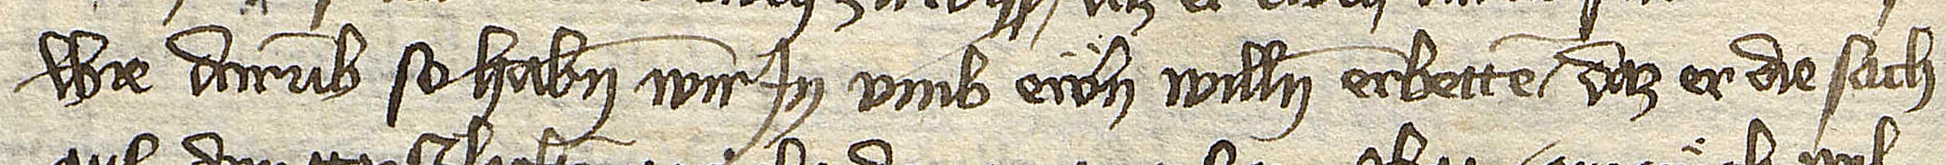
wie darub* ſo habn* wir In vmb eẅ*n willn* erbette* / daʒ er die ſach
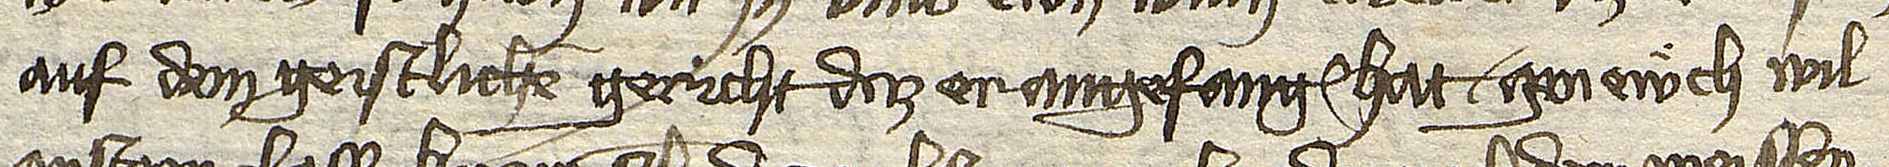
auf dem geiſtliche* gericht daʒ er angefang* hat / gen eẅch wil
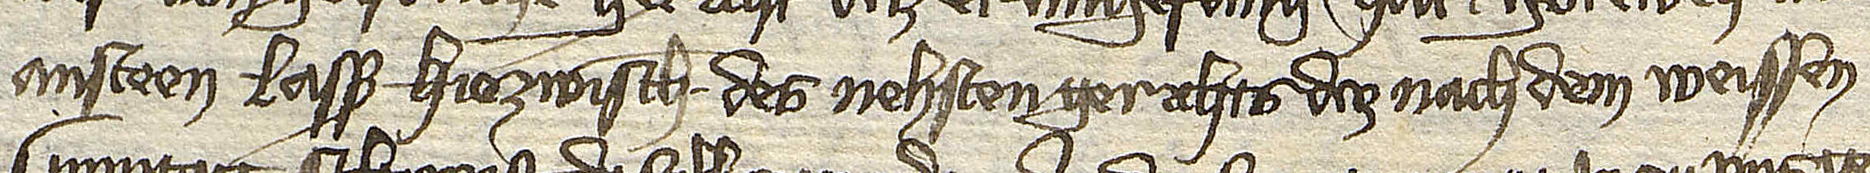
anſteen laſſ* hieʒwiſch* . des nehſten gerichts daʒ nach dem weiſſen
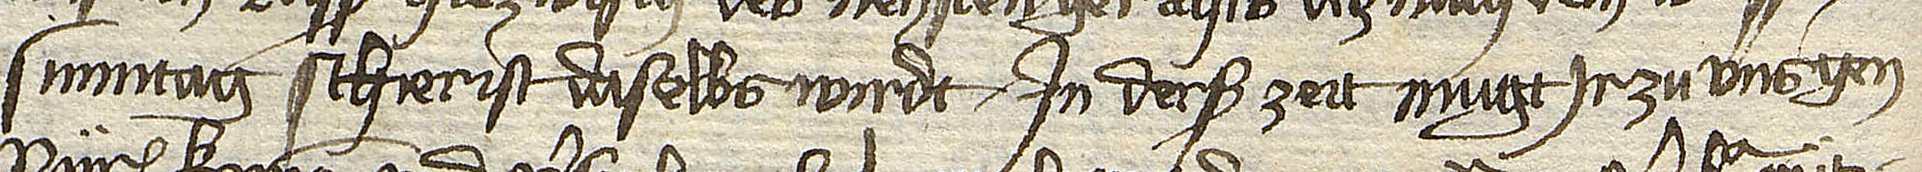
ſunntag ſchieriſt daſelbs wirdt / In derſ* ʒeit mugt Ir ʒu vns gen
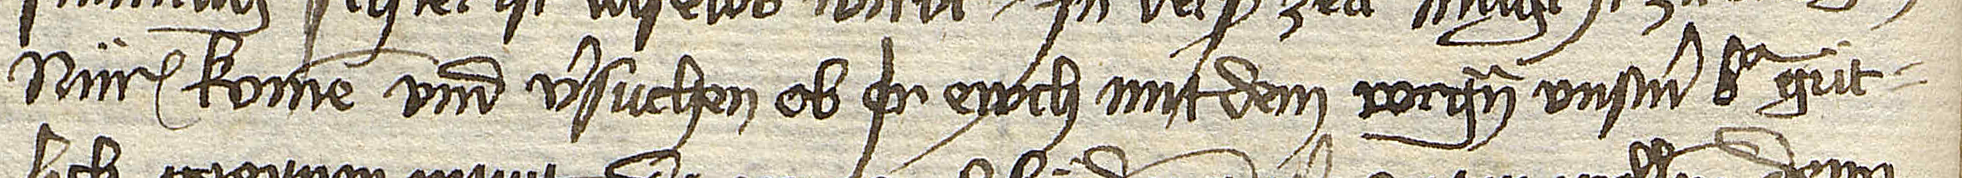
Nür* kome* vnd v*ſuchen ob Ir ewch mit dem vorgn* vnſm* b* güt =
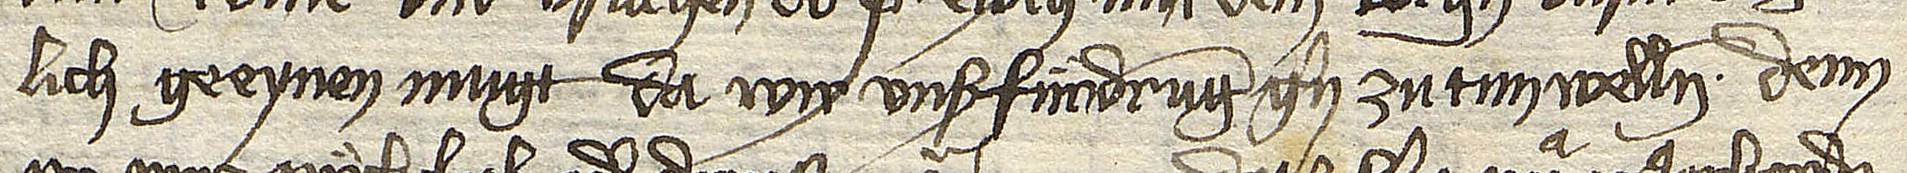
lich geeynen mugt Da wir vnſ* fürdru*g g*n ʒu tun welln* . denn
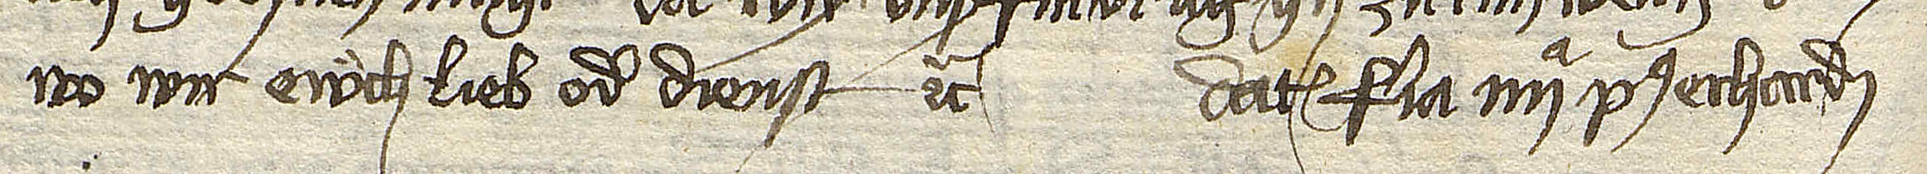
wo wir eẅch lieb od* dienſ ec* Dat* fi*a iiii* p* erhardi
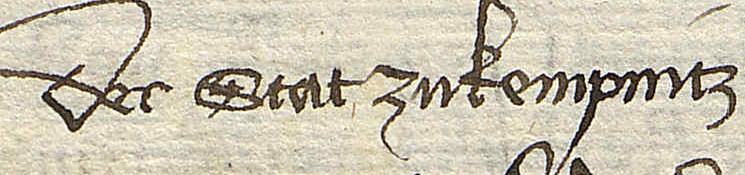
Der Stat ʒu kempnicʒ
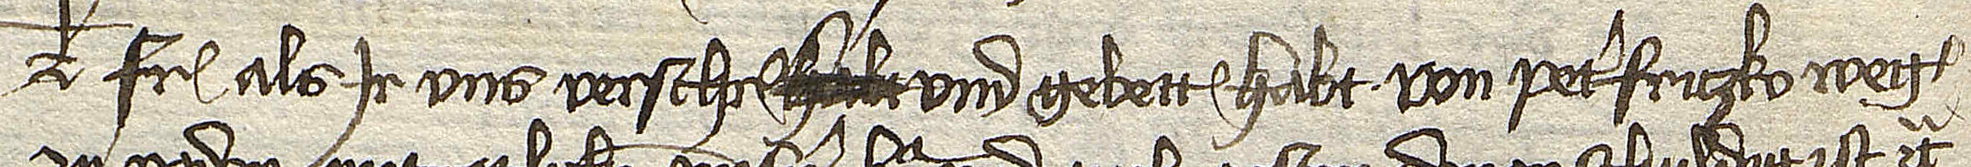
L* fr* als Ir vns verſchr* habt vnd gebett* habt . von Pet* fricʒko weg*
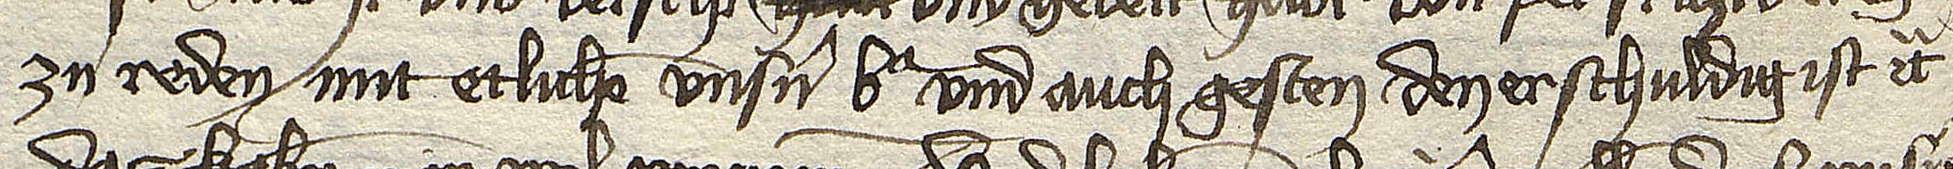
ʒu reden mit etliche* vnſn* b* vnd auch geſten / den er ſchuldig iſt ec*
